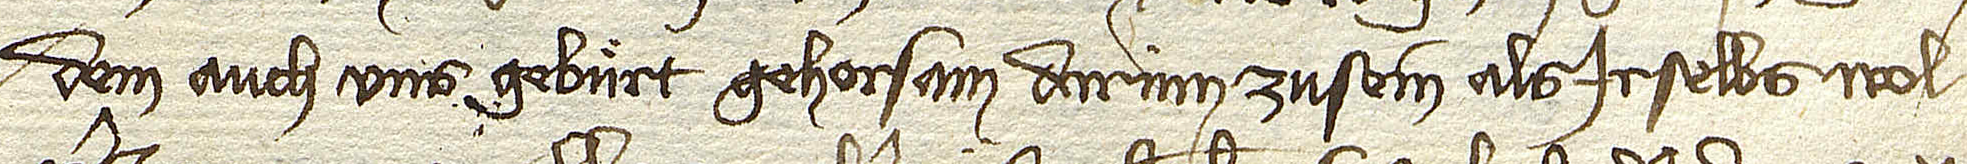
/ dem auch vns gebürt gehorſam darinn ʒu ſein als Ir ſelbs wol
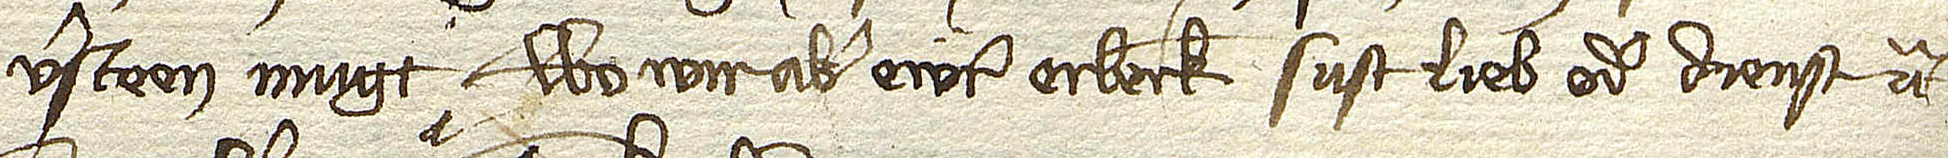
v*ſteen mugt / Wo wir ab* ew*r erberk* ſuſt lieb od* dienſt ec*
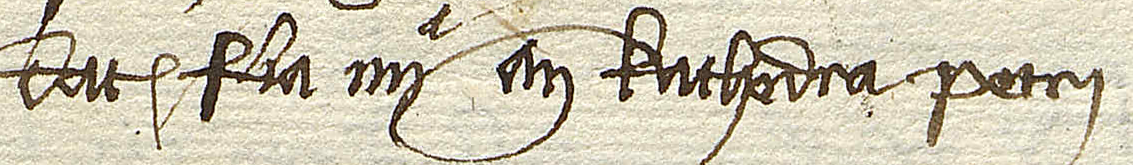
Dat* fia* iiii* an* kathedra petri
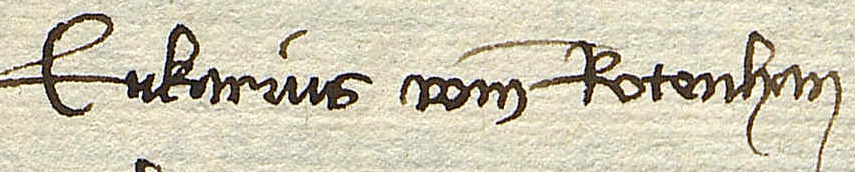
Eukarius vom* Rotenhan
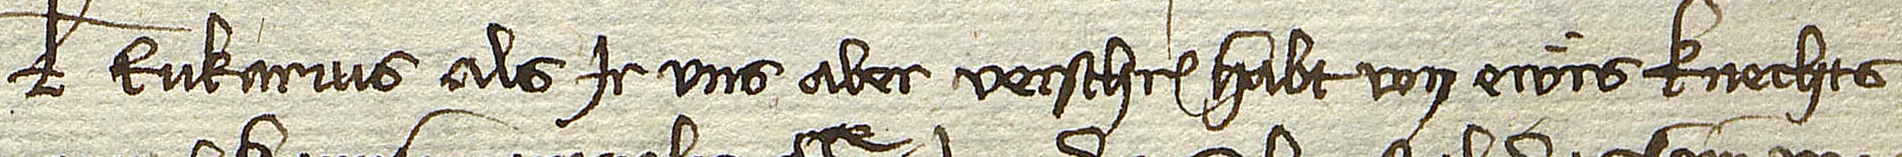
L* Eukarius als Ir vns aber verſchr* habt von ewrs knechts
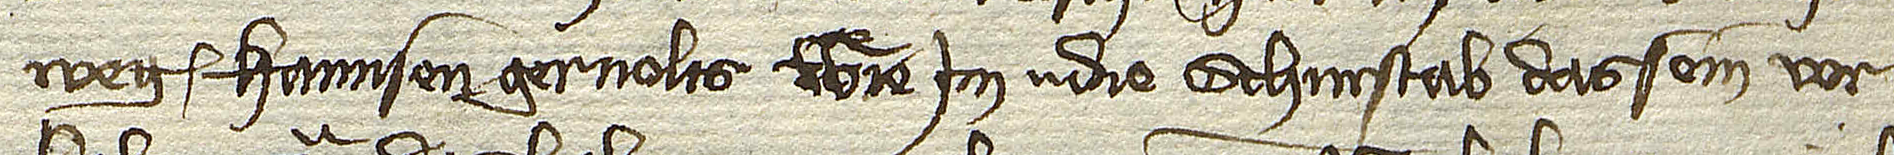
weg* hannſen gernolts Wie Im ~ die Schurſtab das ſein vor
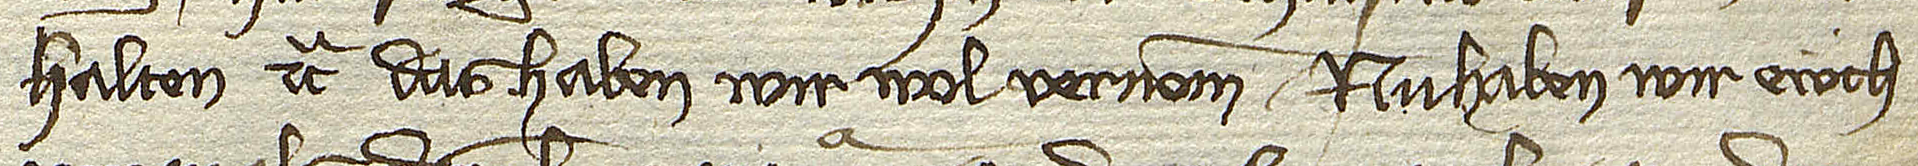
halten ec* das haben wir wol vernom* / Nu haben wir ewch
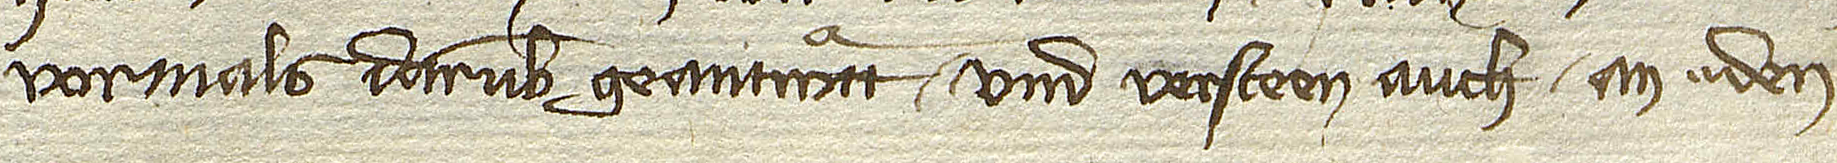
vormals daru*b geantw*tt / vnd verſteen auch / an ~ den
